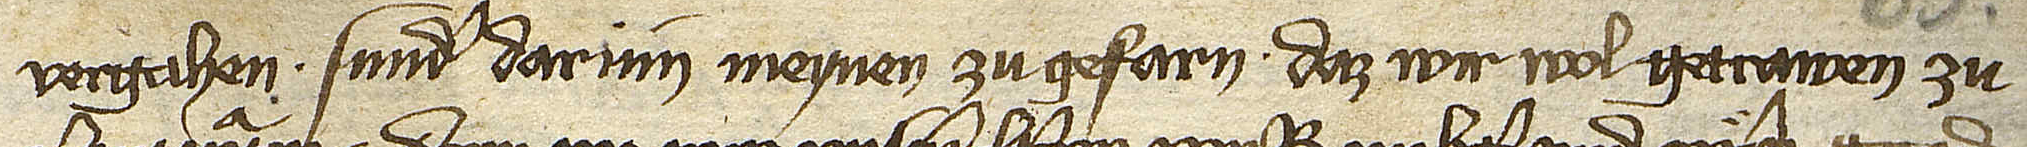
vergahen . ſund* darinn* meynen ʒu gefarn . daʒ wir wol getrawen ʒu
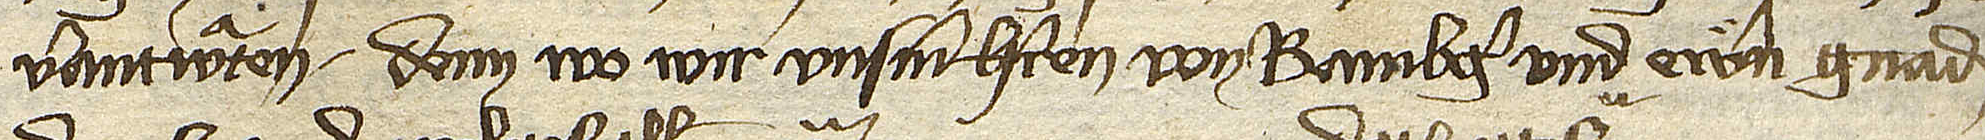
v*antw*ten / Denn wo wir vnſm* h*ren von Bamb*g vnd eẅ*n gnad*
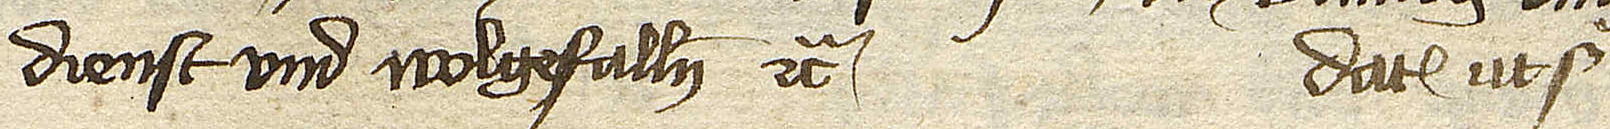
dienſt vnd wolgefalln* ec* Dat* ut ſ*
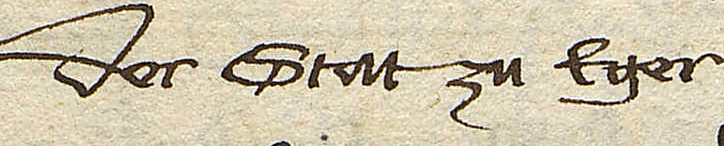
Der Stat ʒu Eger
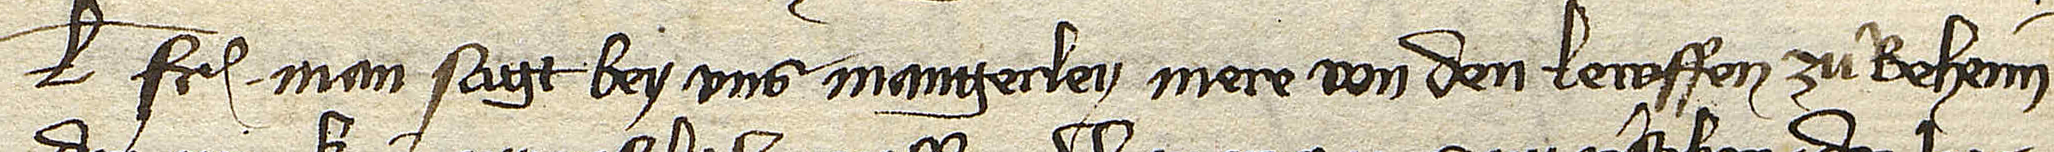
L* fr* / man ſagt bey vns mangerley mere von den lewffen ʒu Beheim
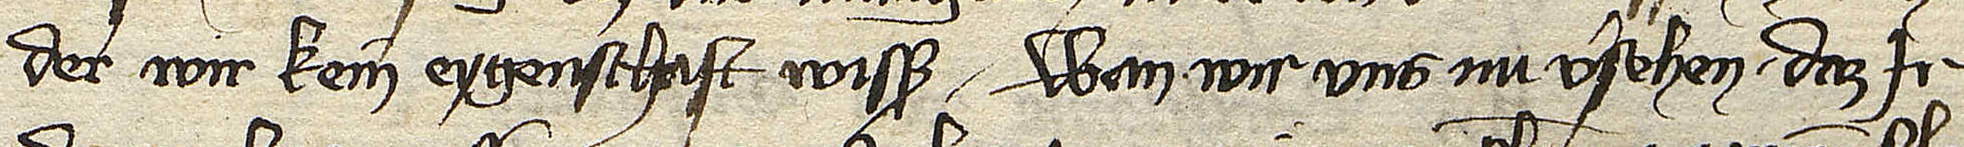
der wir kein eygenſchaft wiſſ* / Wan wir vns nu v*ſehen / daʒ Ir
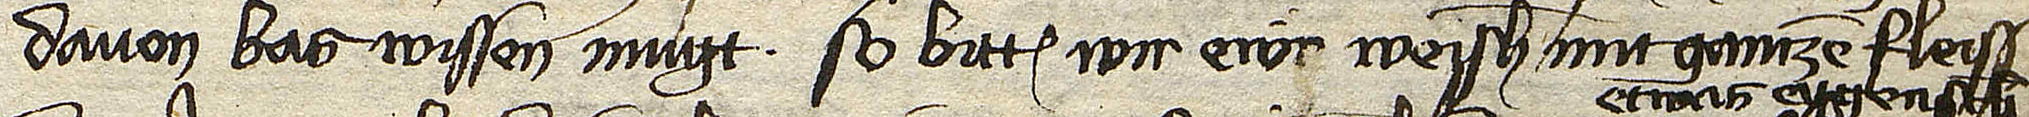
dauon bas wiſſen mugt . ſo bitt* wir eẅr weiſh* mit gancʒe* fleiſſ
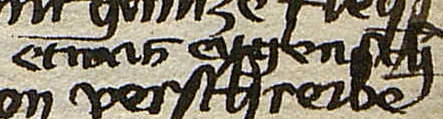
etwas eygenſch*
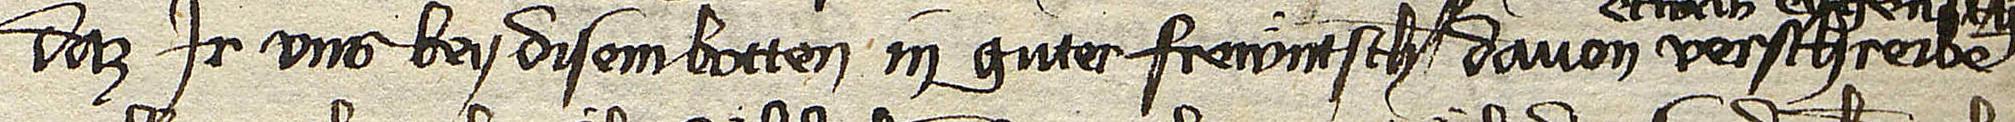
daʒ Ir vns bey diſem botten in guter freẅntlſch* dauon verſchreibe*
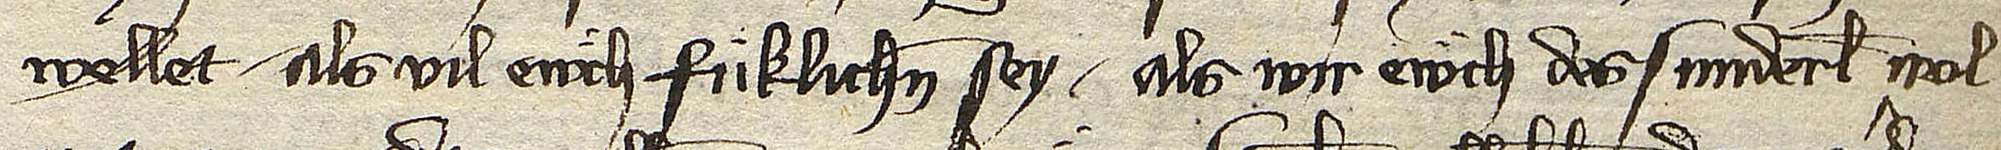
wellet / als vil eẅch füklichn* ſey / als wir eẅch des ſunderl* wol
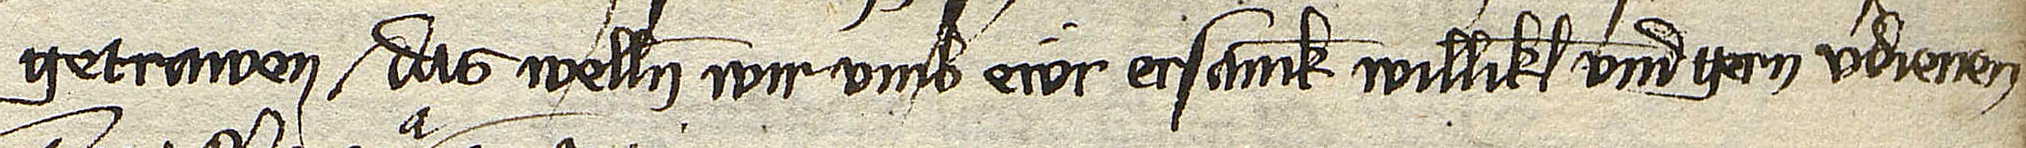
getrawen / das welln* wir vmb eẅr erſamk* willikl* vnd gern v*dienen
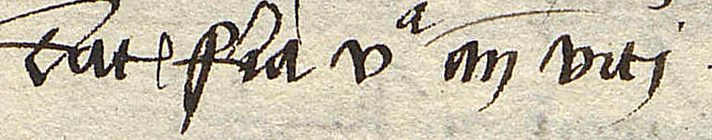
Dat* fi*a v* an* viti
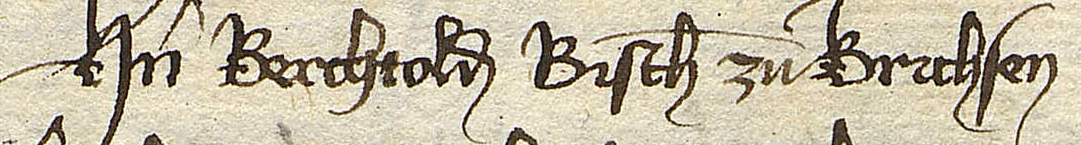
Hn* Berchtold* Biſch* ʒu Brichſen
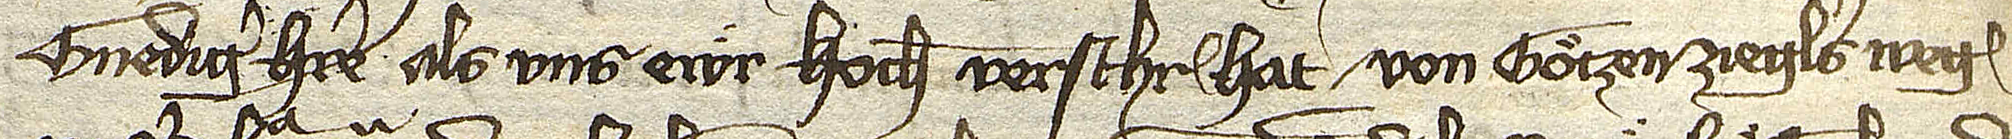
Gnedig* h*re als vns eẅr Hoch* verſchr* hat / von Göcʒen ʒiegl*s weg*
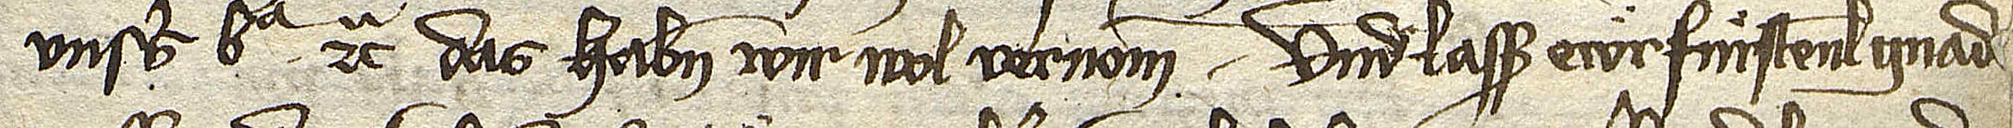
vnſ*s b* ec* das habn* wir wol vernom* / Vnd laſſ* eẅr fürſtenl* gnade
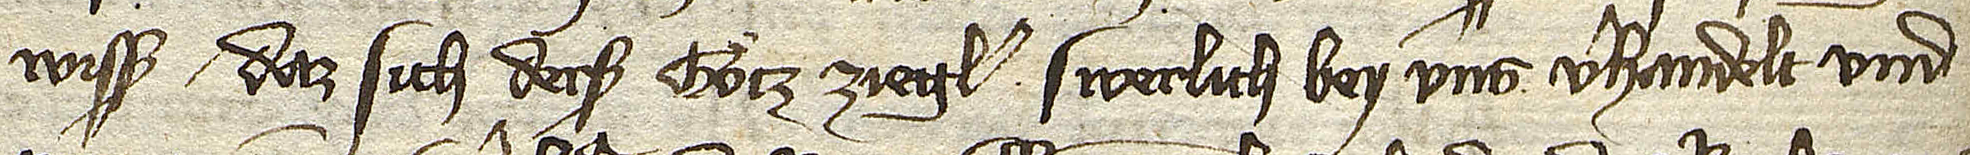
wiſſ* / daʒ ſich derſ* Göcʒ ʒiegl* . ſwerlich bey vns v*handelt vnd
